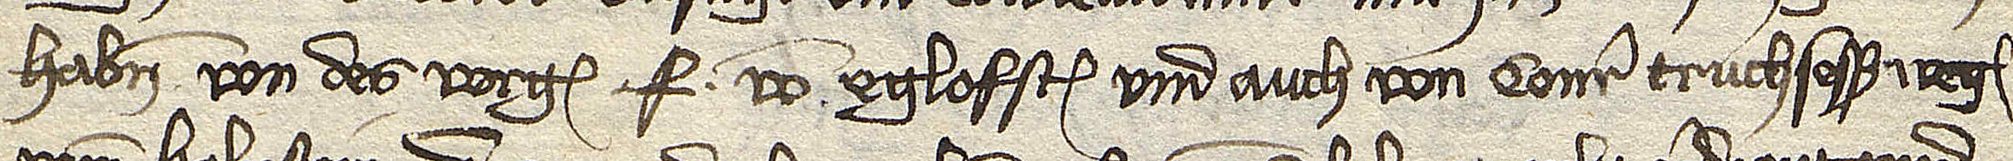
habn* von des vorg* . f . vo* eglofſt* vnd auch von Conr* truchſeſſ* weg*
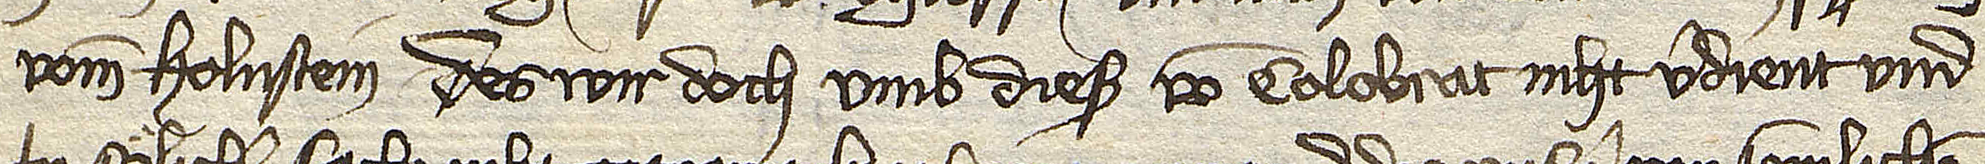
vom* holnſtein / Des wir doch vmb dieſ* vo* Colobrat niht v*dient vnd
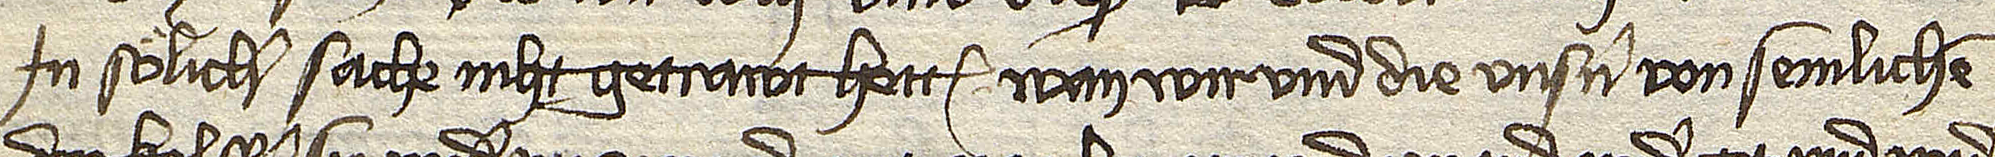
In ſölich* ſache niht getrawt hett* wan wir vnd die vnſn* von ſemliche*
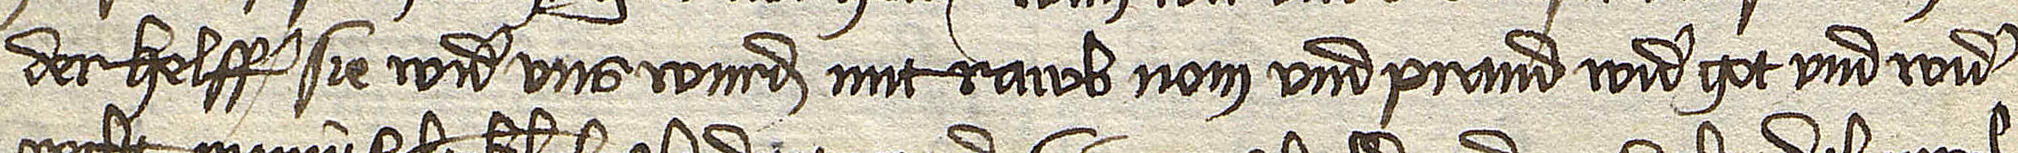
der helff* ſie wid* vns wurd* mit rawb nom vnd prand wid* got vnd wid*
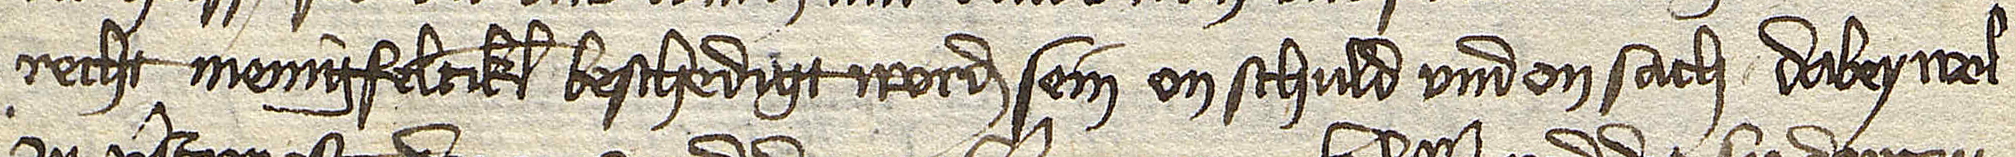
recht menigfeltikl* beſchedigt word* ſein on ſchuld vnd on ſach dabey wol
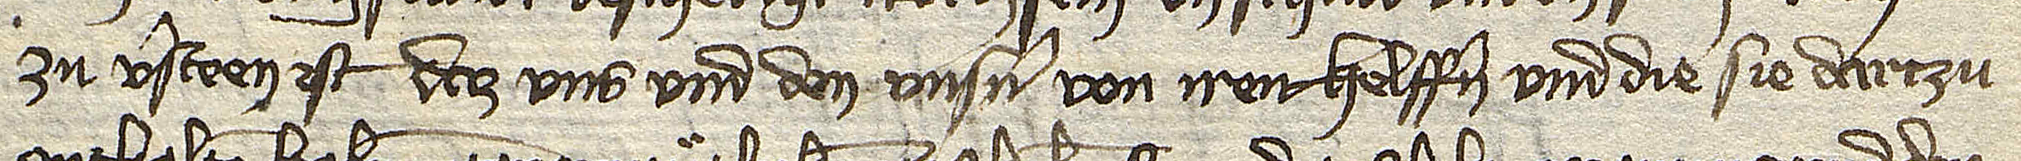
ʒu v*ſteen iſt daʒ vns vnd den vnſn* von iren helff*n vnd die ſie darcʒu
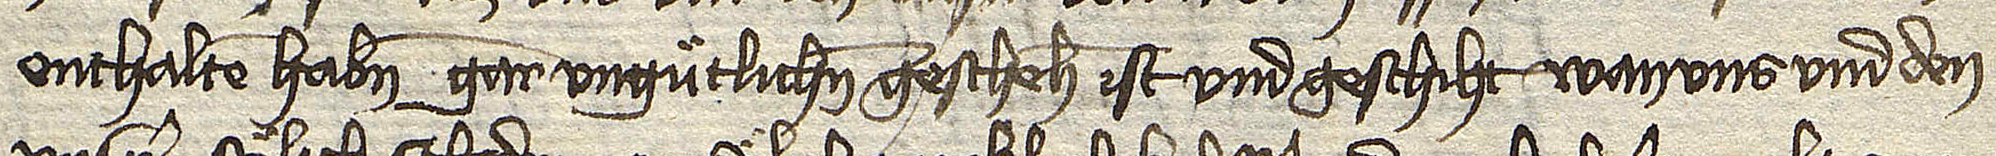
enthalte* habn* gar vngütlichn* geſcheh* iſt vnd geſchiht wan vns vnd den
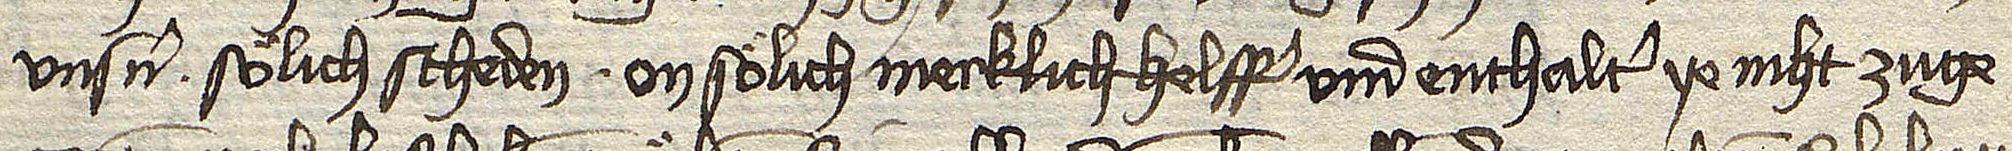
vnſn* . ſölich ſcheden . on ſölich merklich helff* vnd enthalt* ye niht ʒuge
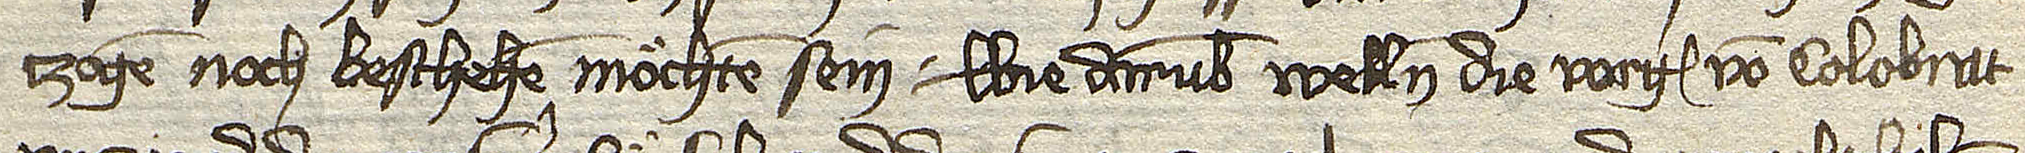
cʒoge* noch beſchehe* möchte* ſein . Wie darub* welln* die vorg* vo* Colobrat
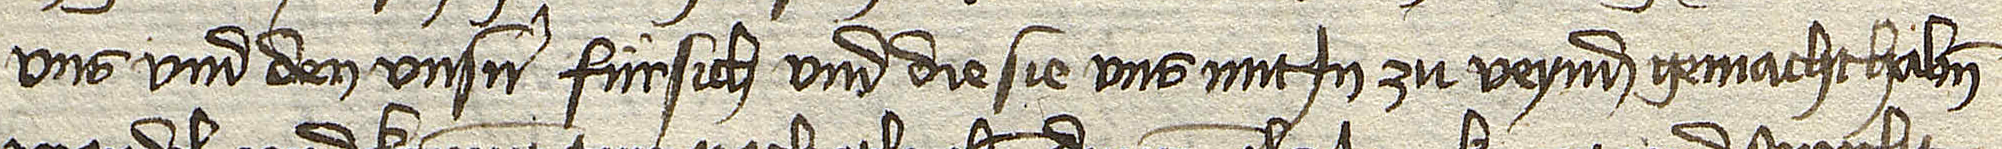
vns vnd den vnſn* für ſich vnd die ſie vns mit In ʒu veynd* gemacht habn*
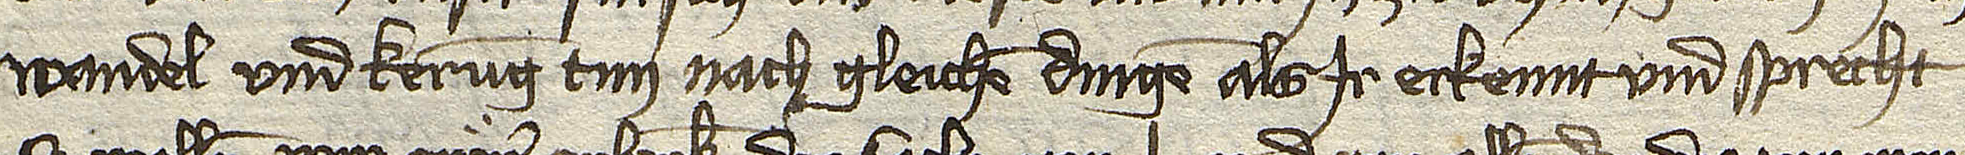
wandel vns keru*g tun nach gleiche* dinge* als Ir erkennt vnd ſprecht
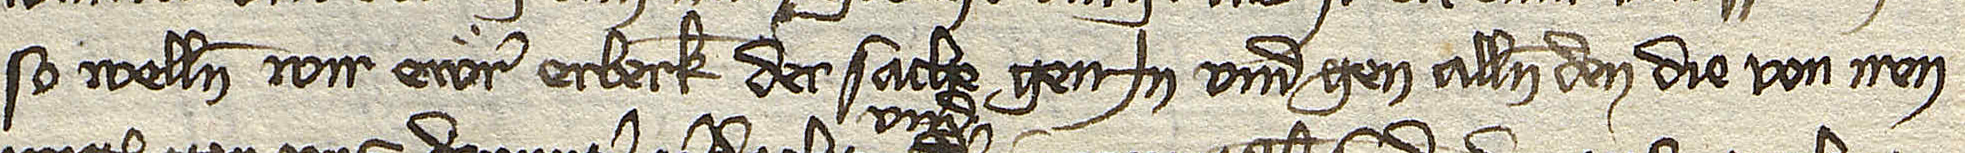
ſo welln* wir eẅr* erberk* der ſache gen In vnd gen alln* den die von iren
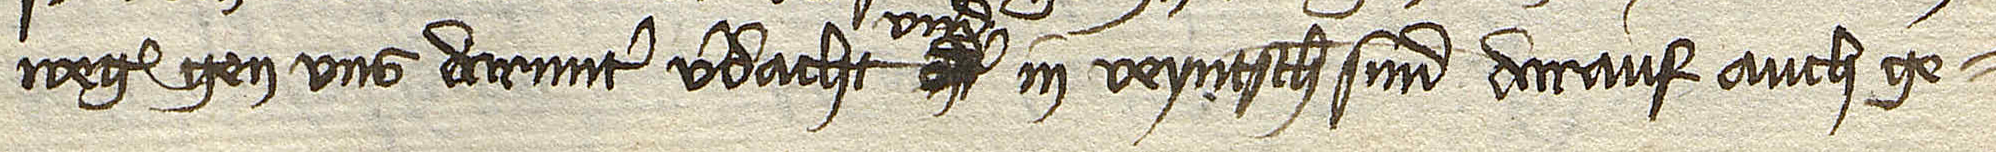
weg* gen vns darunt* v*dacht od* in veyntſch* ſind darauf auch ge =
